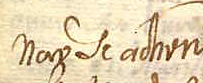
naõ se achou
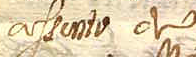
assento do
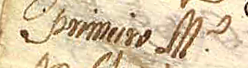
primeiro M.o
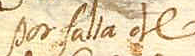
por falta de
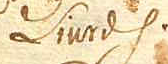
Liuros.
